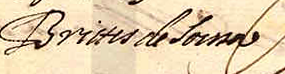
Brittes de Sousa
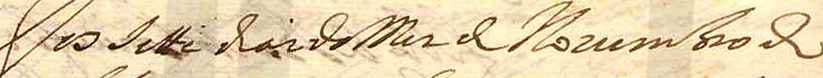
Aos sette diaz do Mez de Nouembro de
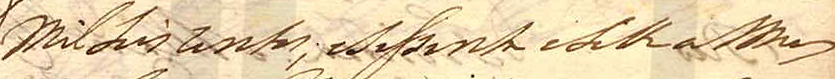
Mil seiscentos; e sessenta e sette aNNos
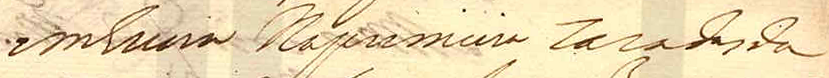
em Euora Na primeira caza das da
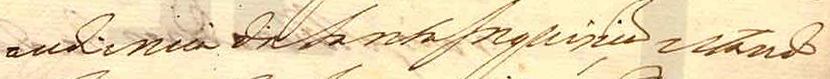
audiencia da santa Jnquisiçaõ estando
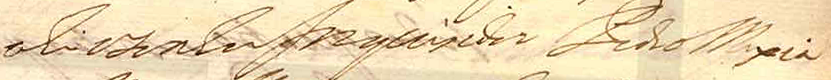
ali o Senhor Jnquisidor Pedro Mexia
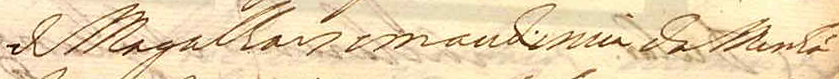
de Magalhaes em audiencia da Menhã
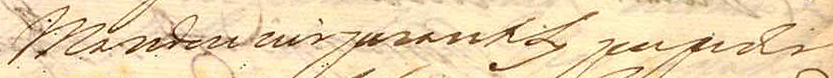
Mandou uir perante sy por pedir
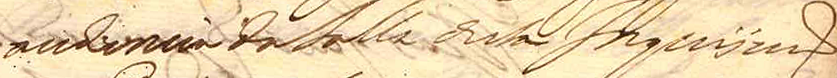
audiencia da salla desta Jnquisiçaõ
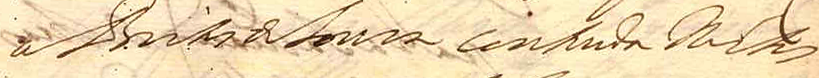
a Brites de Souza conteuda Nestes
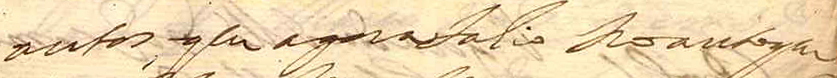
autos, que agora Sahio No auto que
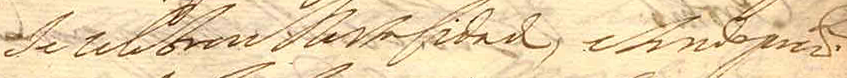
Se celebrou Nesta Cidade, estando prez.te
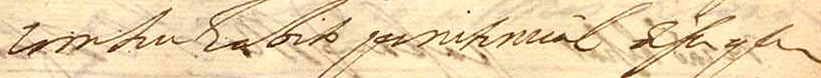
Com Seu habito penitencial disse que
